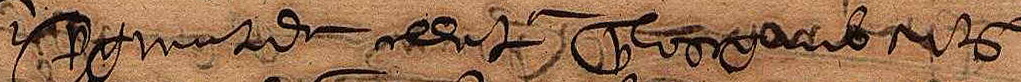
item p̄gumtada ella ta p̄lo segundo arto
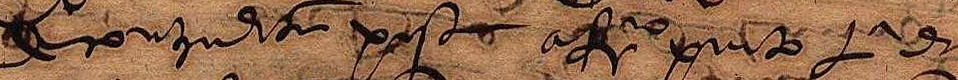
de contradita posta a frco pinto ta da
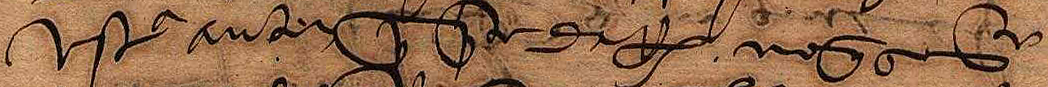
justa autor p̄o p̄te da Rꝭ no q̄ somte
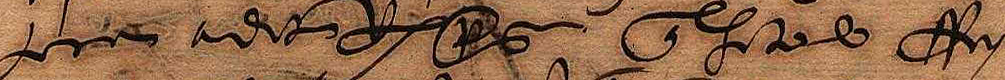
toca a dita Rꝭ p̄sa q̄ lhe todo ffoy
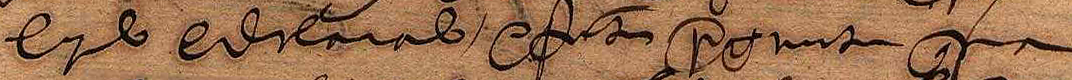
lydo e declarado / e fecta p̄gunta q̄ era
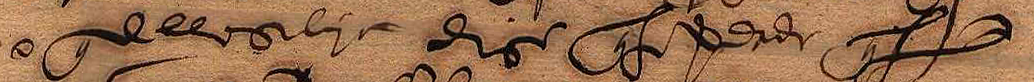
o q̄ dello sabya dise q̄ he ꝟdade q̄ ho
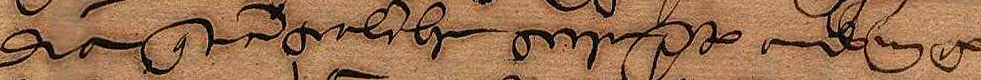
dia q̄ nā se alēbra se era sāto ou domj̄go
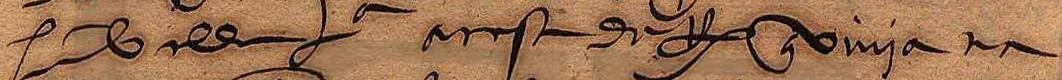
hindo ella ta a casa da Rꝭ q̄ viuja na
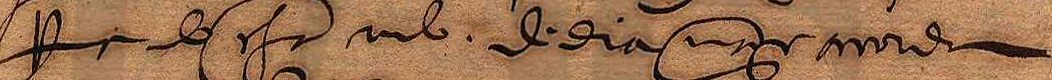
Rua do chācudo . de dia nā se acorda
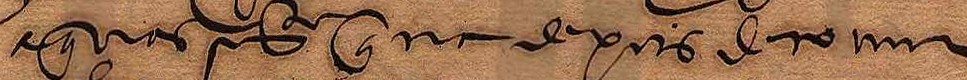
a q̄ oras somte q̄ era depois de comer
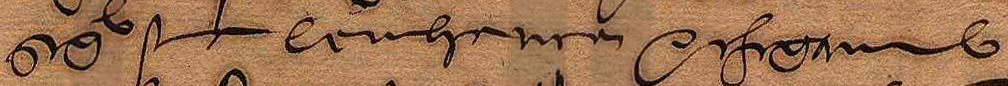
segdo sua lembrança e chegando
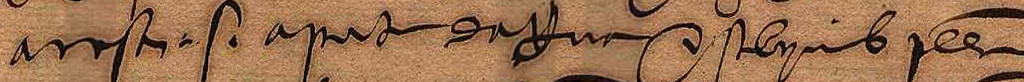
a casa .s. a porta da Rua ē sahyndo pl̄la
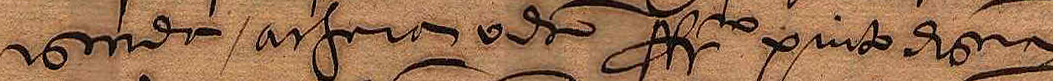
estrada / achara o dtō ffrco pinto disera
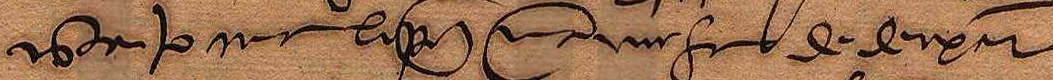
esta Joana lopez nā me ha de deixar
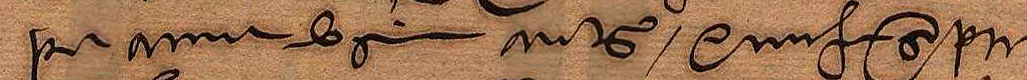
por amor do seu anto / e me ha sēpre
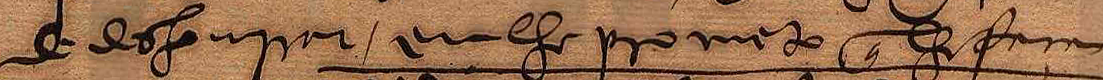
de deshonrrar / eu lhe prometo q̄ lhe faça
